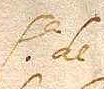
f.a de
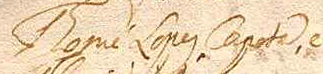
Thomé Lopez Capote, e
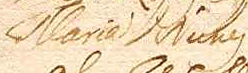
Maria Nunes
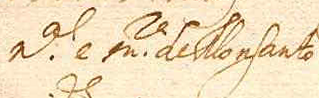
n.al e m.ra de Monsanto
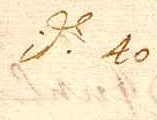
id.e 40
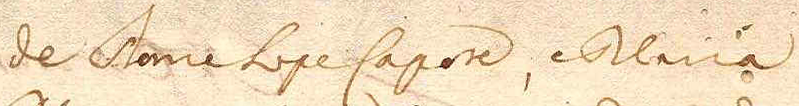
de Thome Lope Capote, e Maria
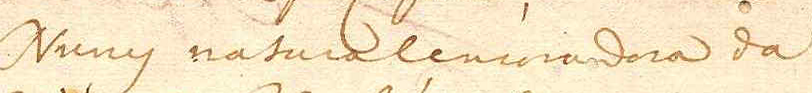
Nunes natural, e moradora da
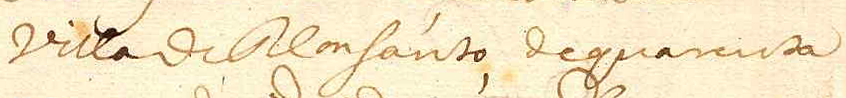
Villa de Monsanto, de quarenta
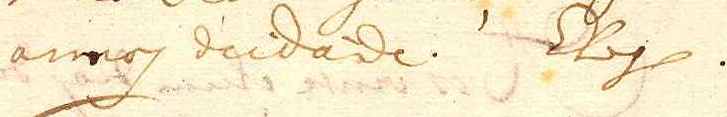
annos de idade. E logo.
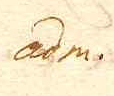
adm.
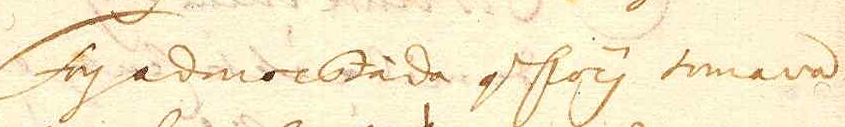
Foy admoestada q̄ pois tomava
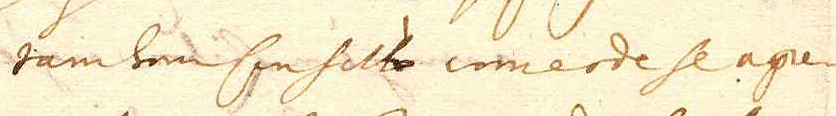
tam bom Conselho como o de se apre
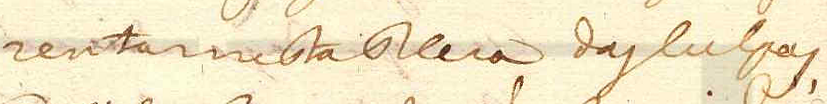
zentar nesta Meza das Culpas,
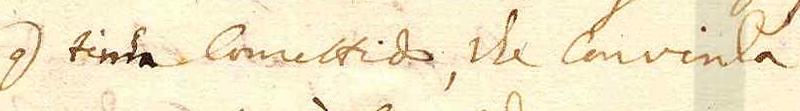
q̄ tinha Comettido, lhe convinha
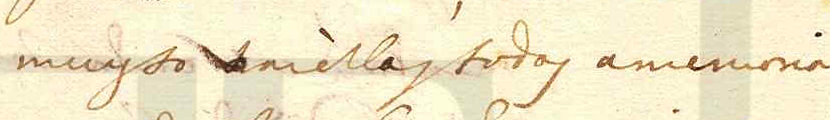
muyto trazellas todas a memoria
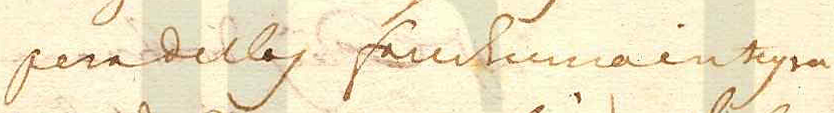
pera dellas fazer huma inteyra
